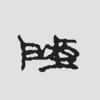陵
